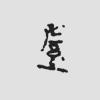壺
